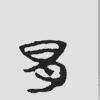日月
